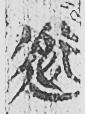{行幺止}
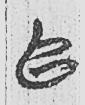𠂤
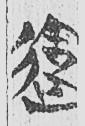御
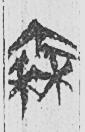秦
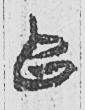𠂤
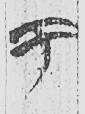于
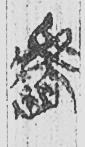{山虎口}
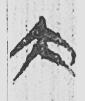大
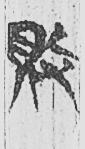敗
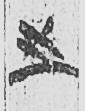之
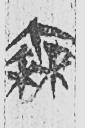秦
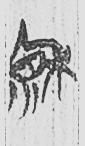穆
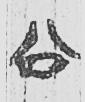公
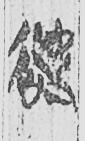欲
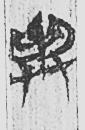與
